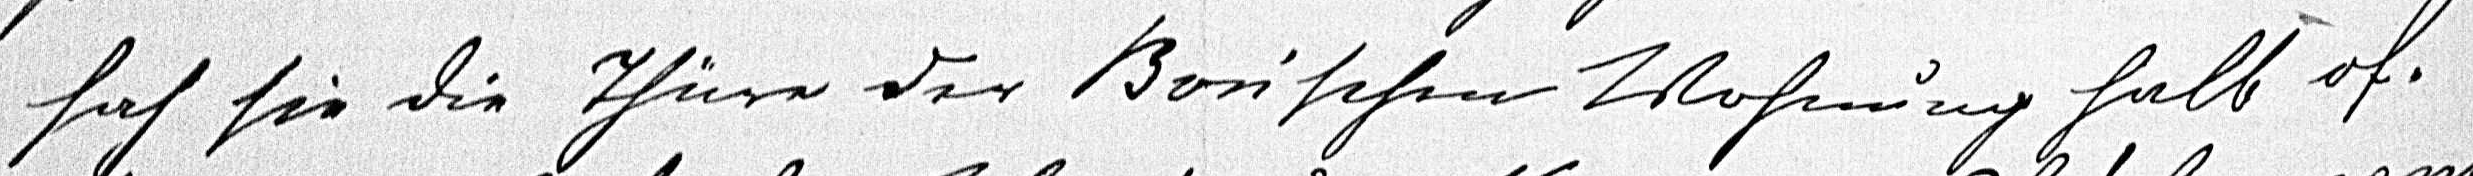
hat sie die Thüre der Bonischen Wohnung halb of¬
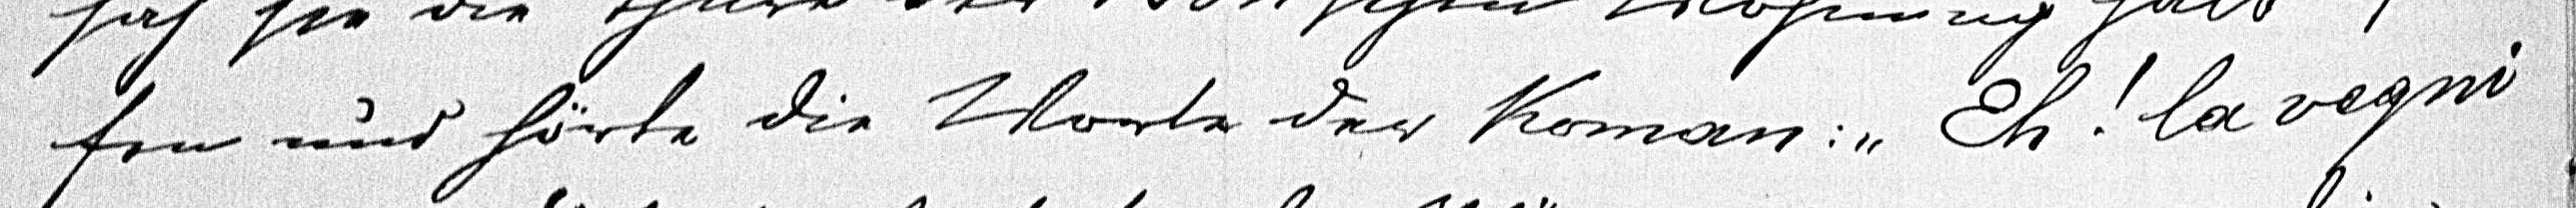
fen und hörte die Worte der Koman: „Eh! La vegni
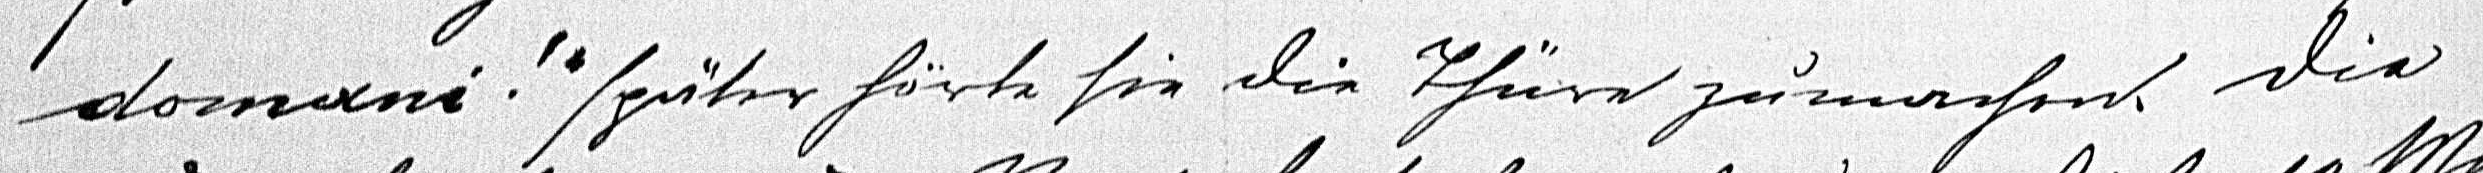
domani!“ Später hörte sie die Thüre zumachen. Die
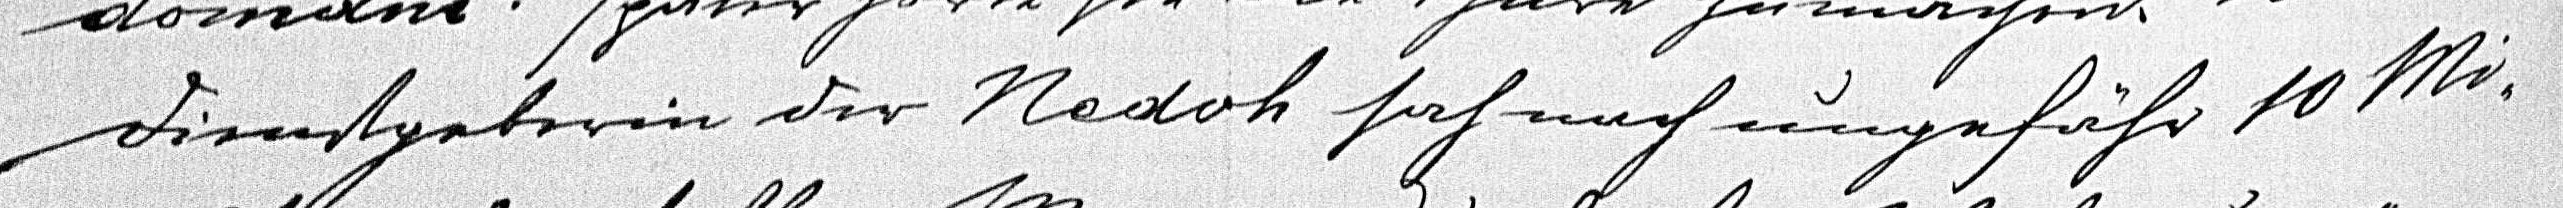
Dienstgeberin der Nodoli sah nach ungefähr 10 Mi¬
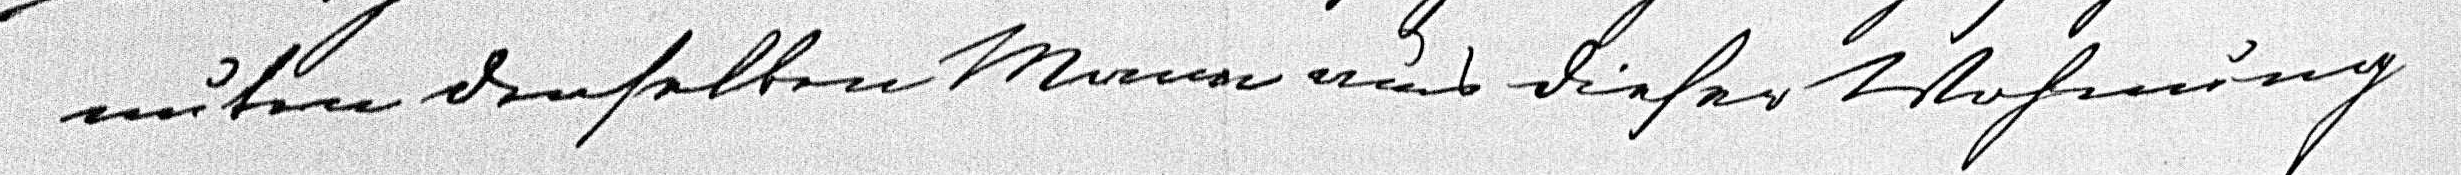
nuten denselben Mann aus dieser Wohnung
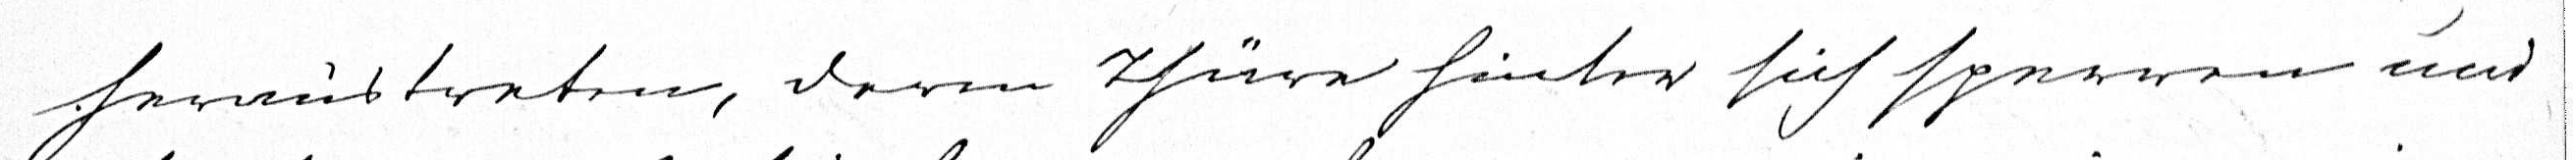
heraustreten, deren Thüre hinter sich sperren und
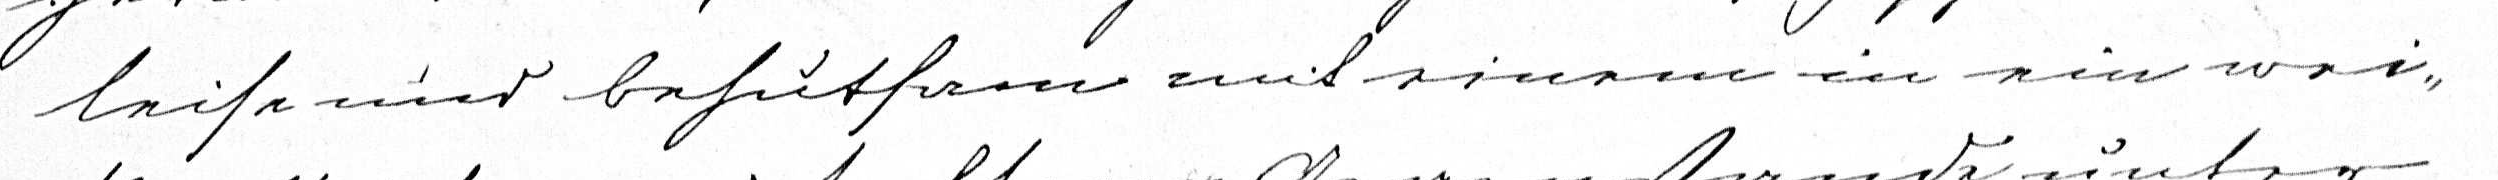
leise und behutsam mit einem in ein wei¬
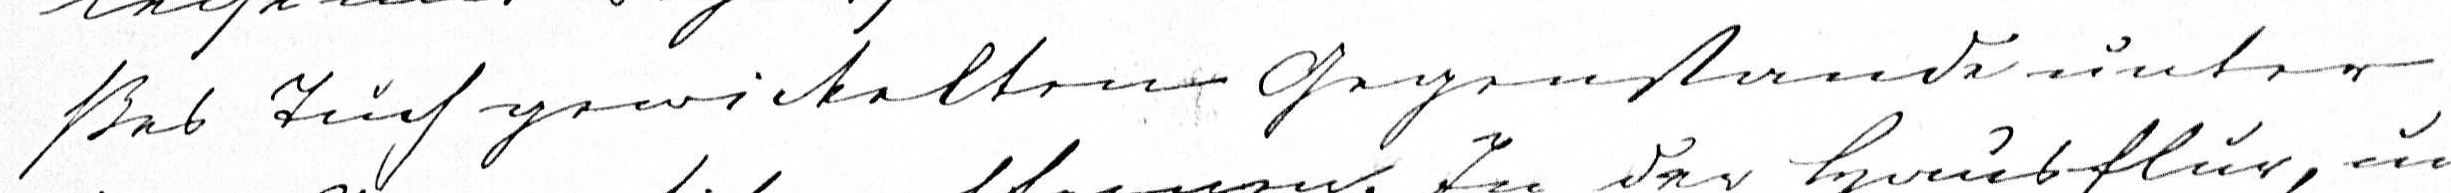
ßes Tuch gewickelten Gegenstande unter
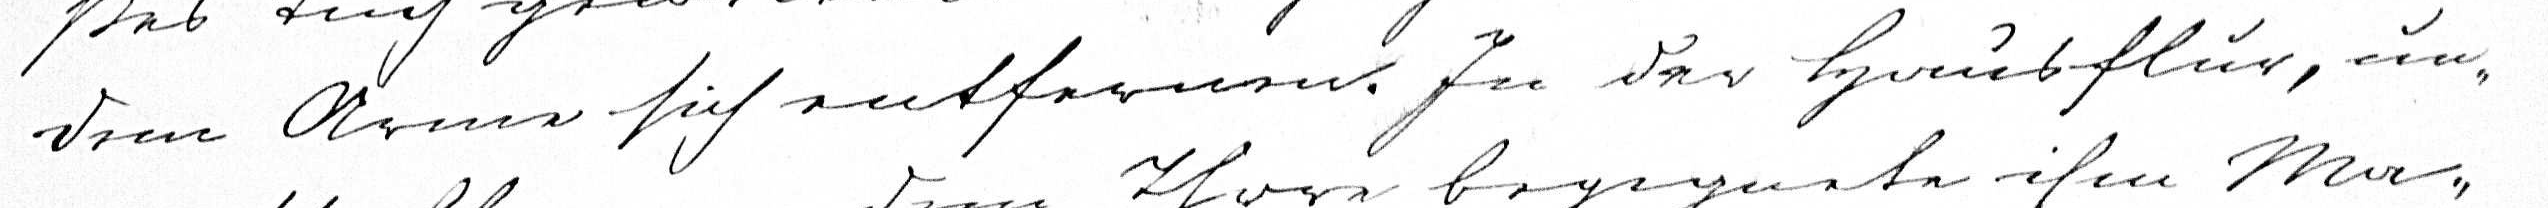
dem Arme sich entfernen. In der Hausflur, un¬
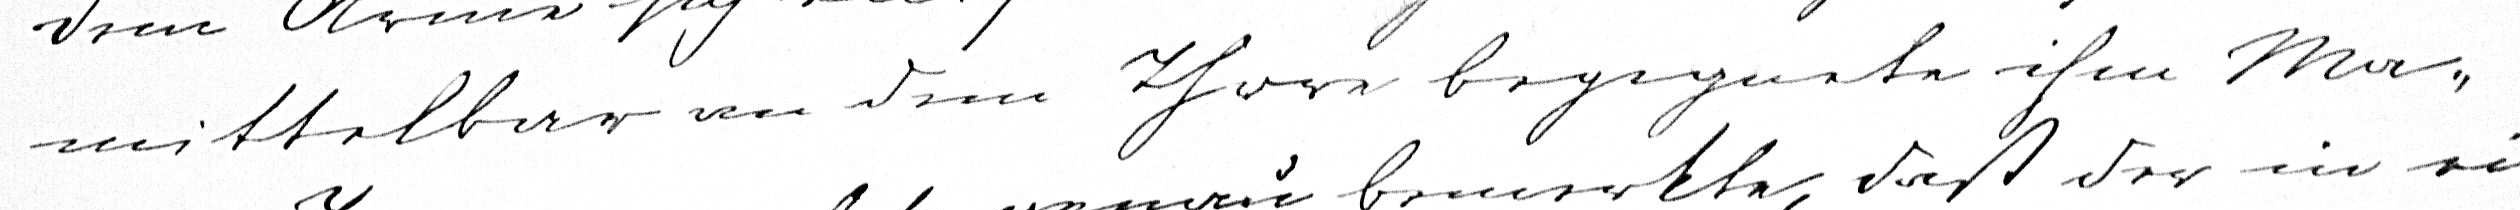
mittelbar an dem Thore begegnete ihm Ma¬
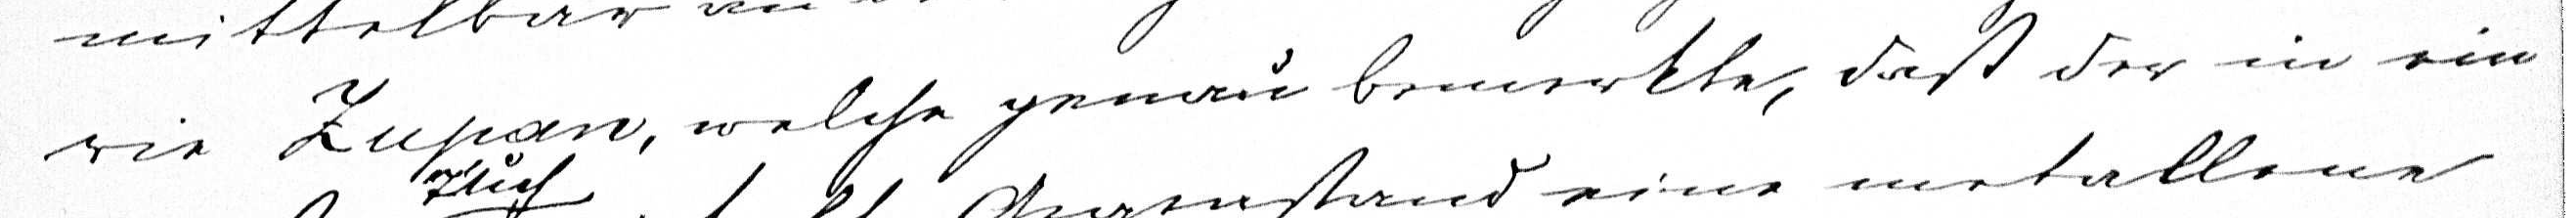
ria Zupan, welche genau bemerkte, daß der in ein
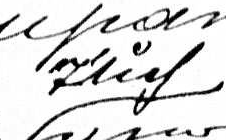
Tuch
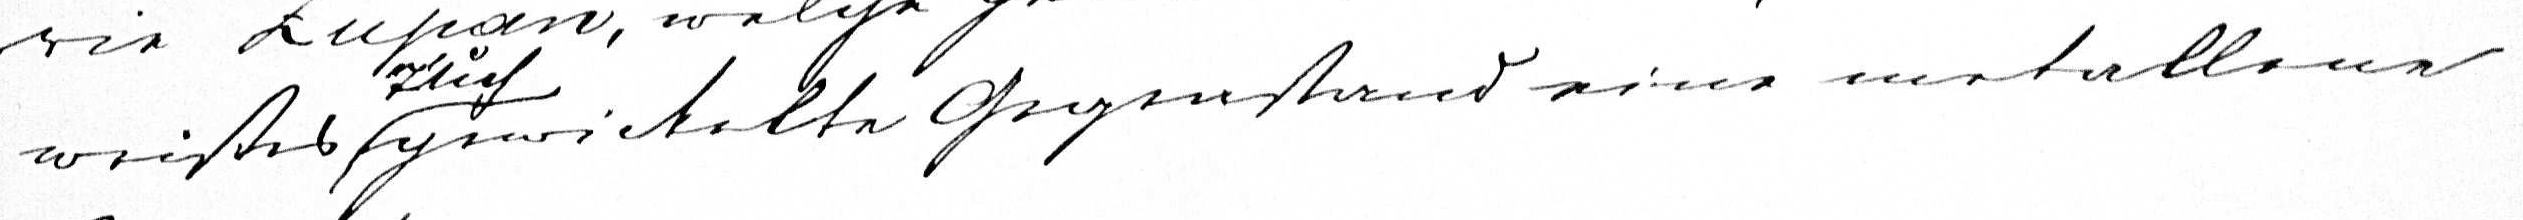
weißes gewickelte Gegenstand eine metallene
